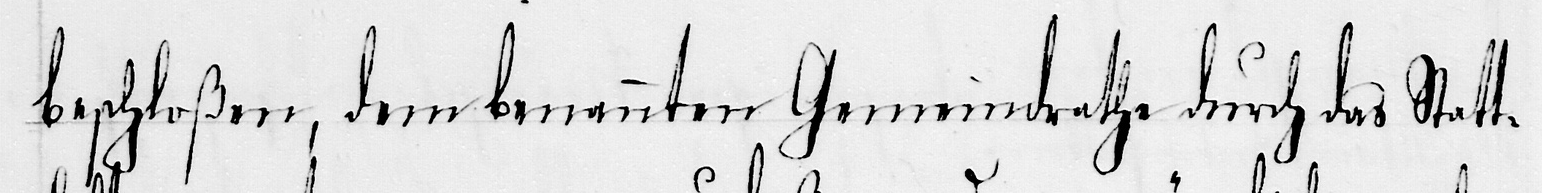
beschloßen, dem benannten Gemeindrathe durch das Stat¬
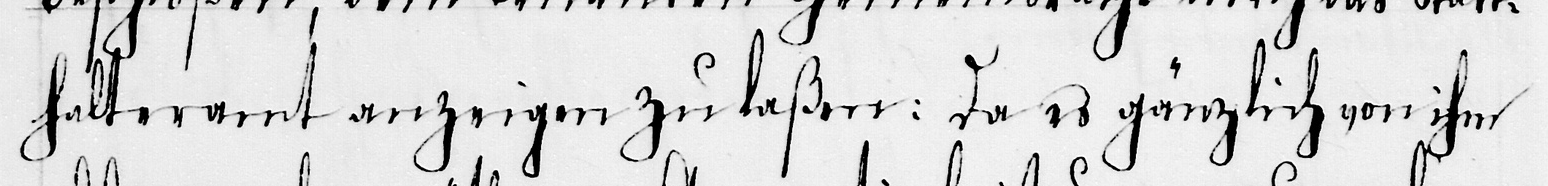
thalteramt anzeigen zu laßen: Da es gänzlich von ihm
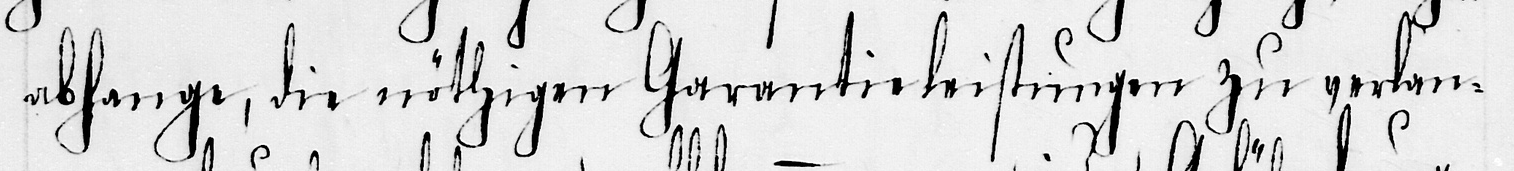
abhange, die nöthigen Garantieleistungen zu verlan¬
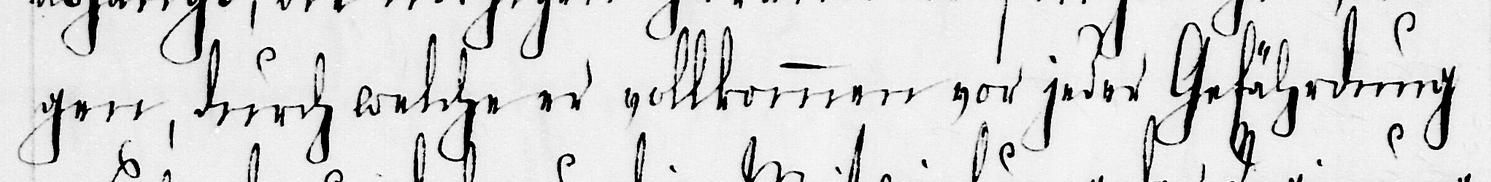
gen, durch welche er vollkommen vor jeder Gefährdung
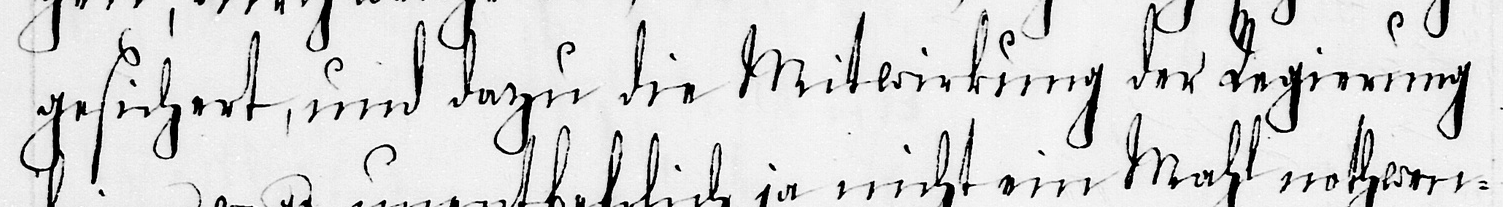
gesichert, und dazu die Mitwirkung der Regierung
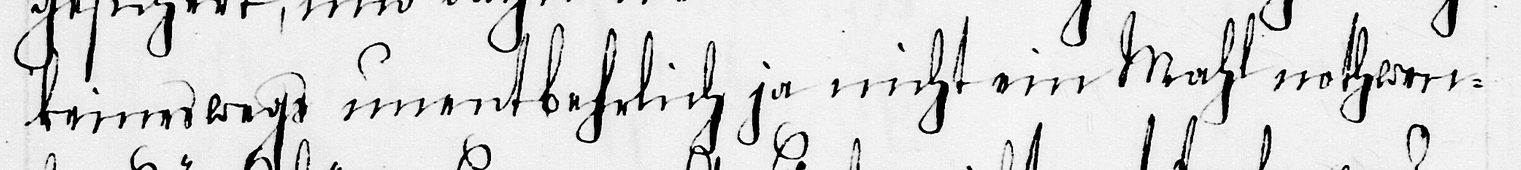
keineswegs unentbehrlich ja nicht ein Mahl nothwen¬
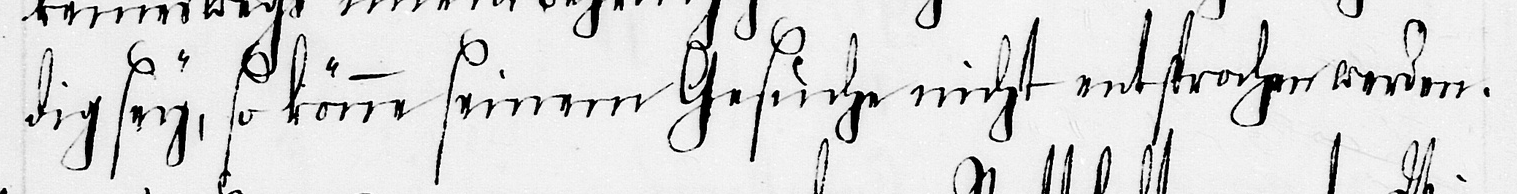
dig sey, so könne seinem Gesuche nicht entsprochen werden.
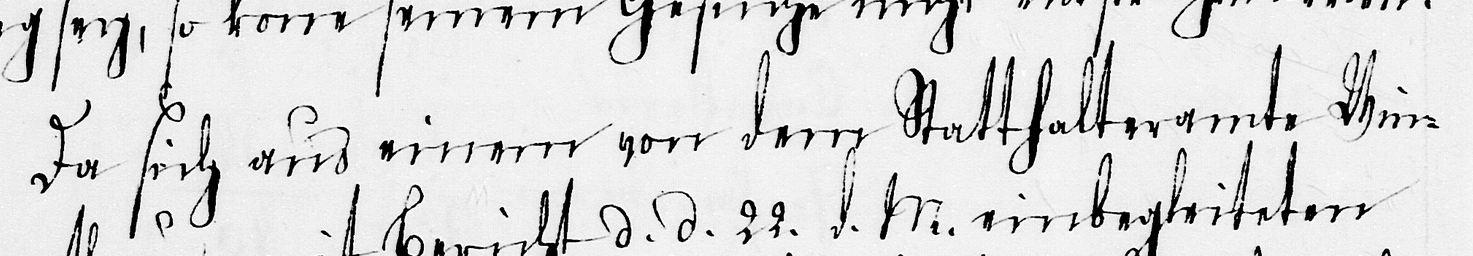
Da sich aus einem von dem Statthalteramte Win¬
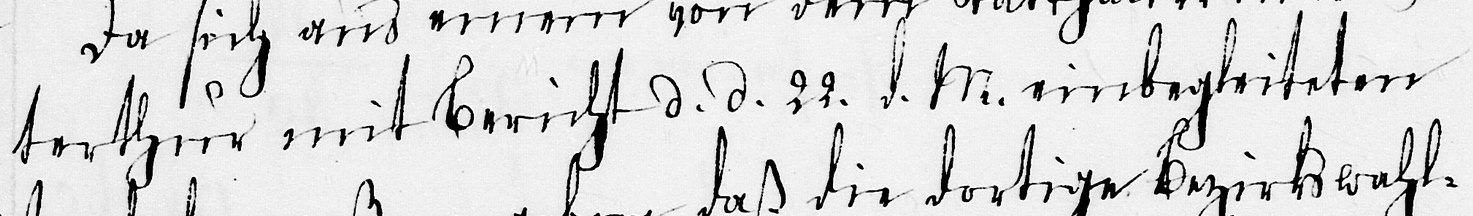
terthur mit Bericht d. d. 22. d. M. einbegleiteten
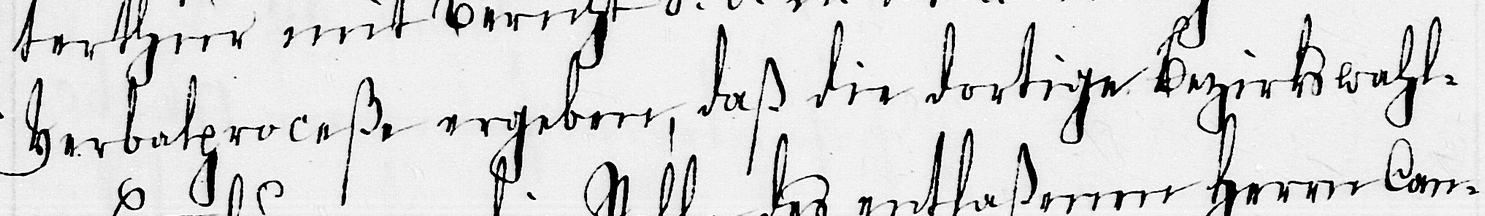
Verbalproceße ergeben, daß die dortige Bezirkswahl¬
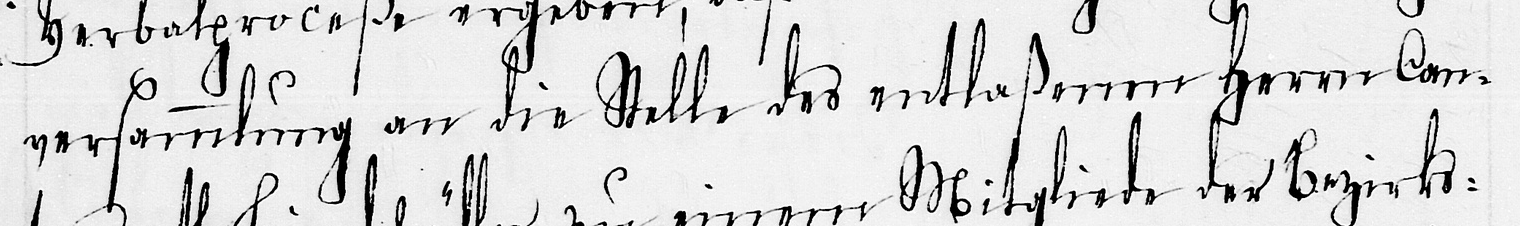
versammlung an die Stelle des entlaßenen Herrn Can¬
